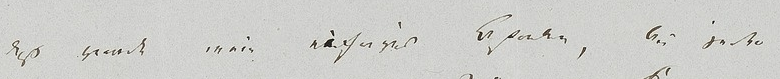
daß gerade mein eifriges Bestreben, bei jeder
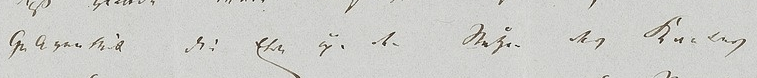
Gelegenheit die Ehre &. den Nutzen des Kantons
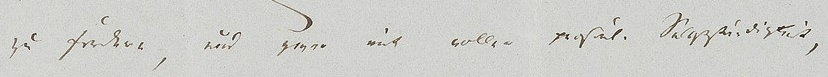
zu fördern, und zwar mit voller persönl. Selbstständigkeit,
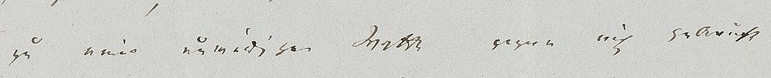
zu einer unwürdigen Wette gegen mich gebraucht
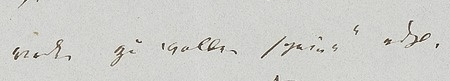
werden zu wollen scheine» udgl.
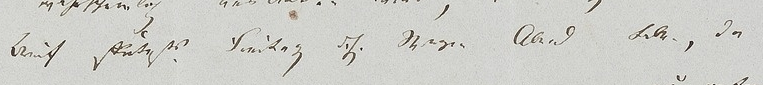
Brief spätestsFreitag d. h. Morgen Abend haben, da
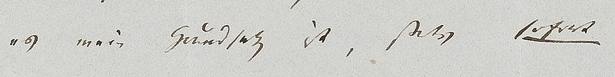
es mein Grundsatz ist, stets sofort
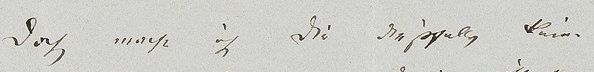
Doch mache ich Dir dießfalls keine
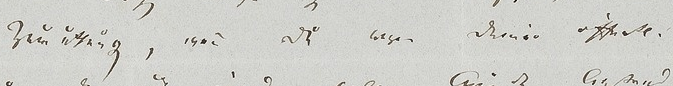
Zumuthung, wenn Du wegen Deiner öffentl.
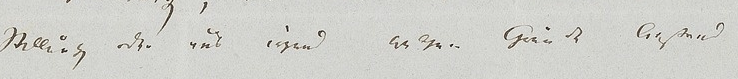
Stellung oder aus irgend welchen Gründen Anstand
